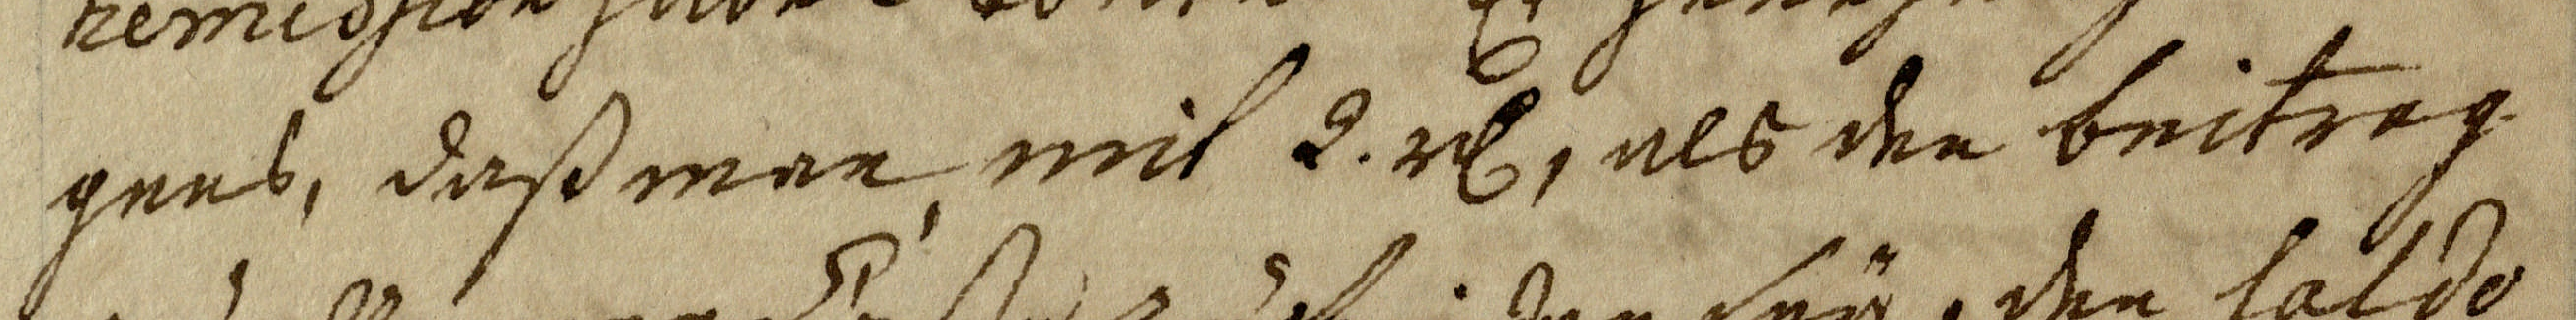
gens, daß man mit 2. rl, als den Beitrag
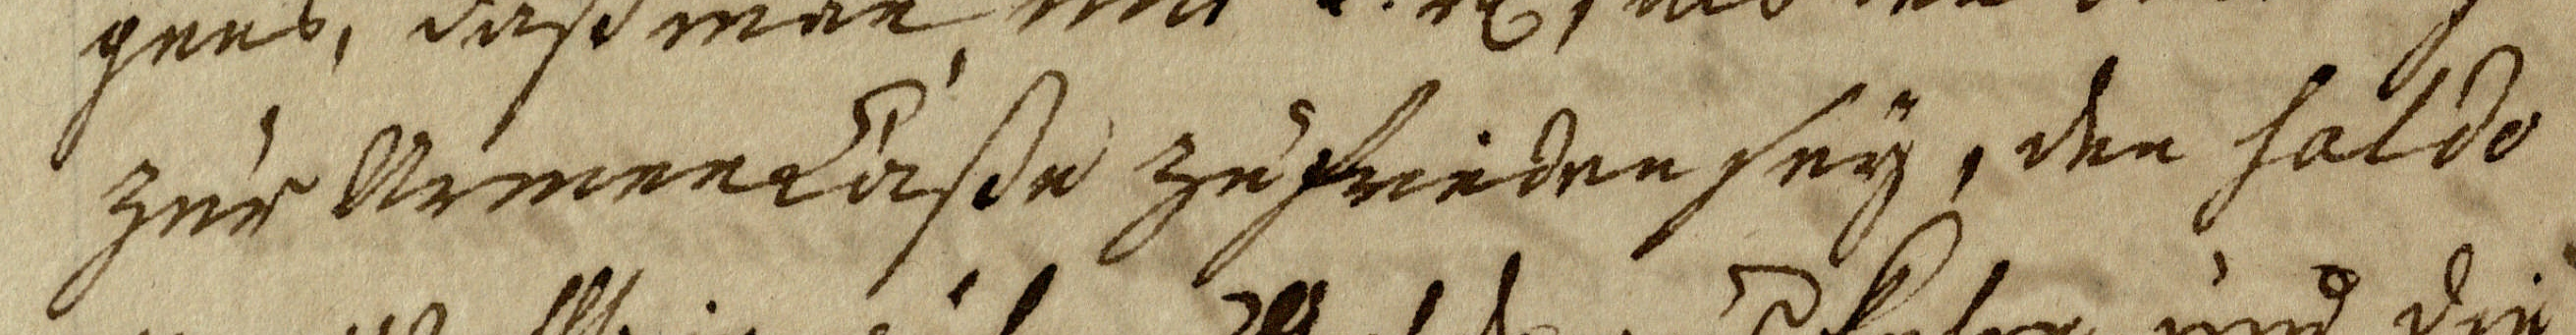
zur ArmenCaße zufrieden seÿ, den saldo
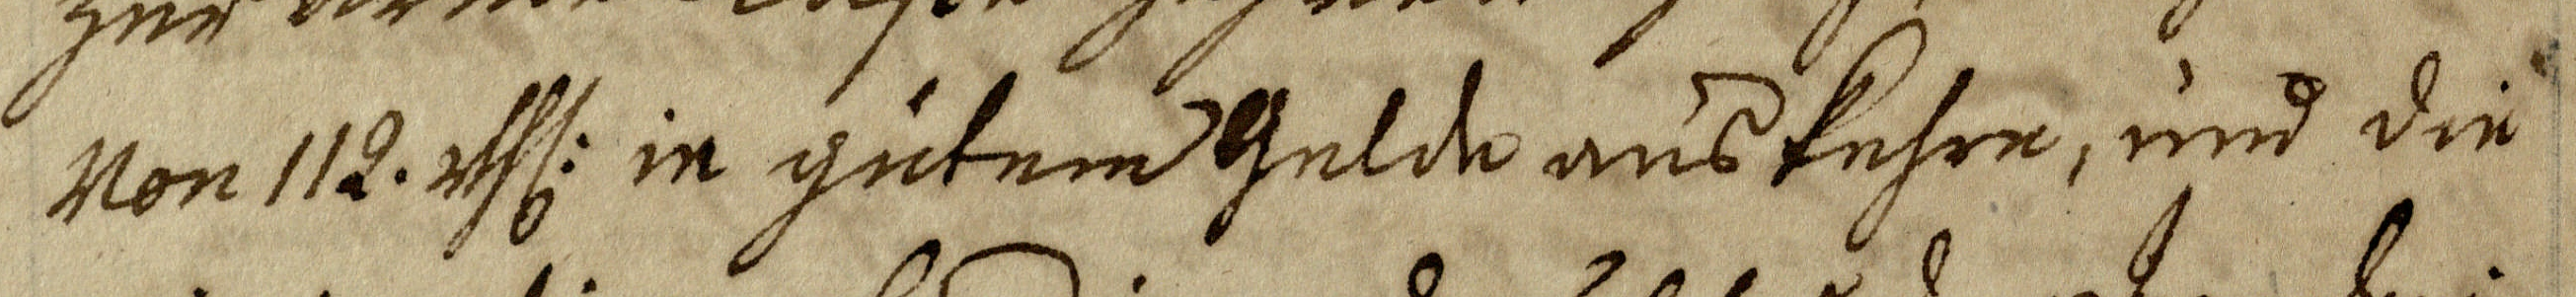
von 112 rth. in gutem Gelde auskehre, und die
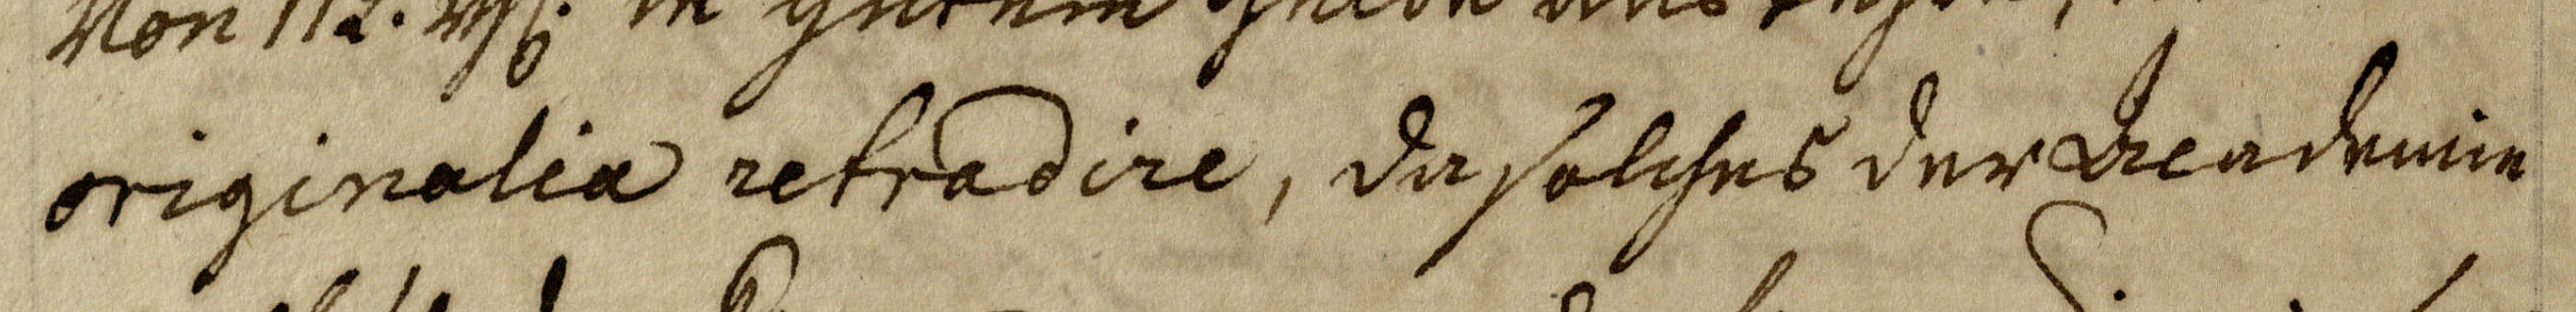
originalia retradire, da solches der Academie
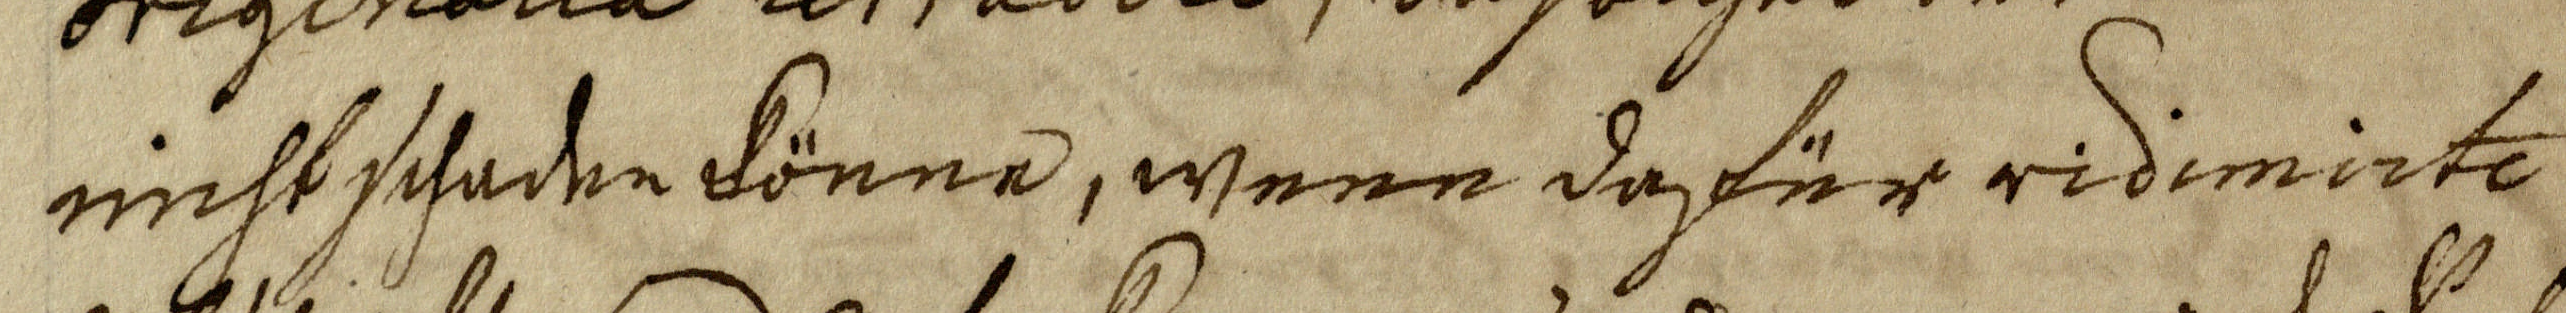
nicht schaden könne, wenn dafür vidimirte
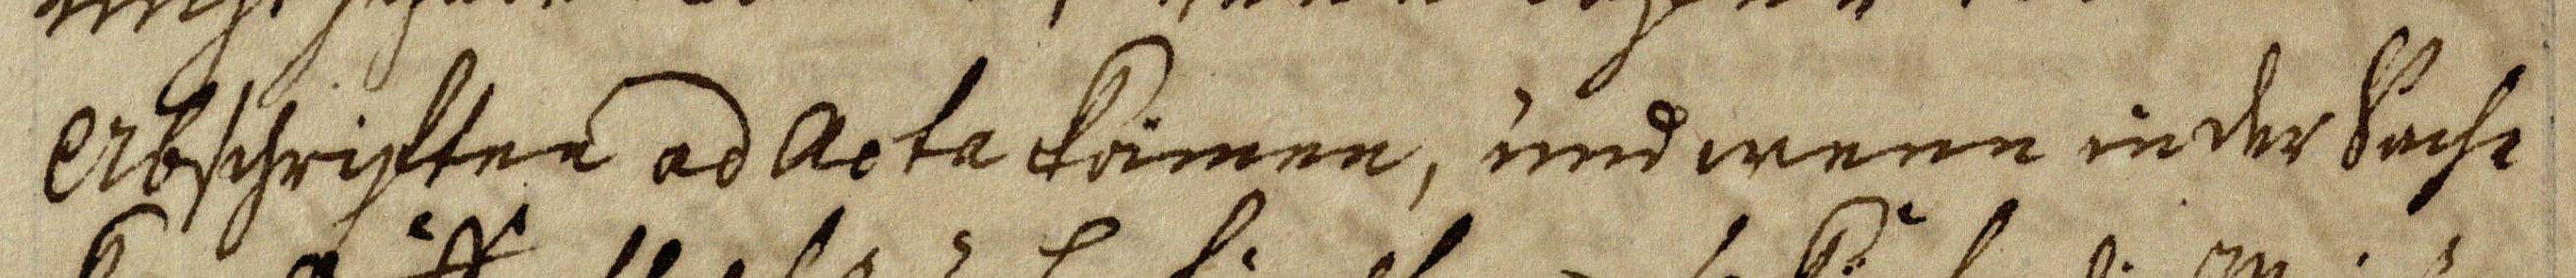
Abschriften ad Acta kämen, und wenn in der Sache
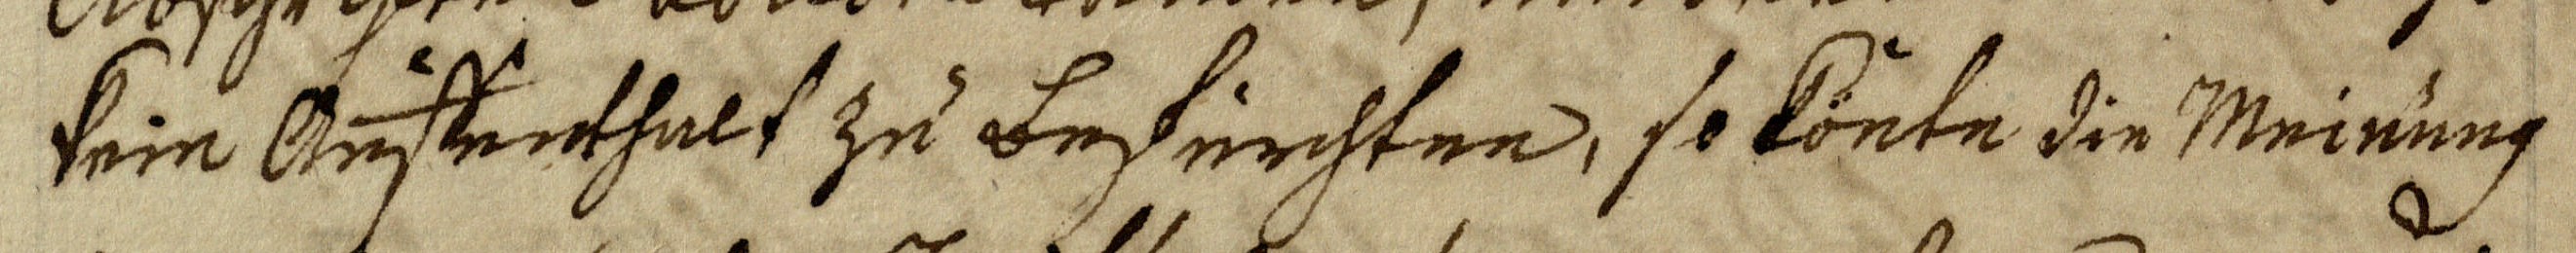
kein Aufenthalt zu befürchten, so könte die Meinung
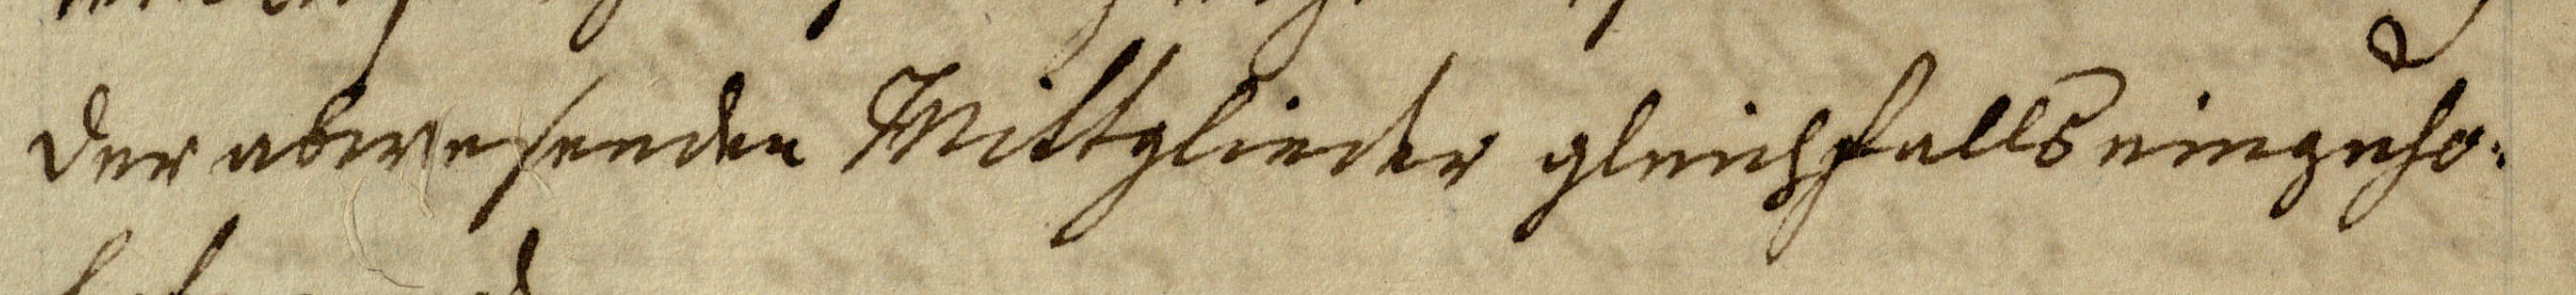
der abwesenden Mittglieder gleichfalls eingeho¬
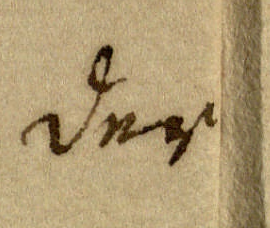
Der
